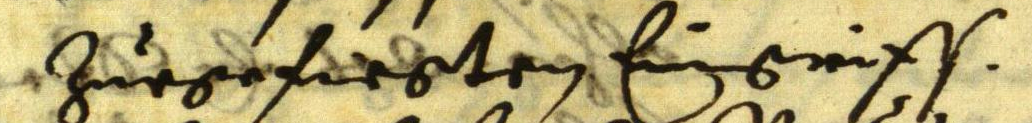Zūegefiegten Eingrifs.
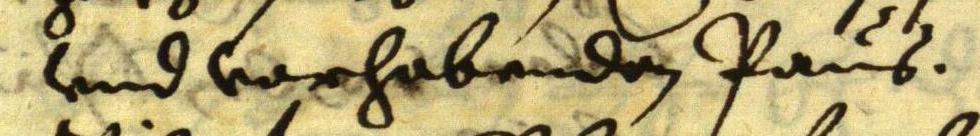vnd vorhabenden Paūs.
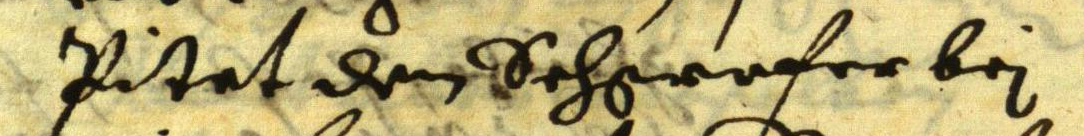Pitet dem Schgrafer bej
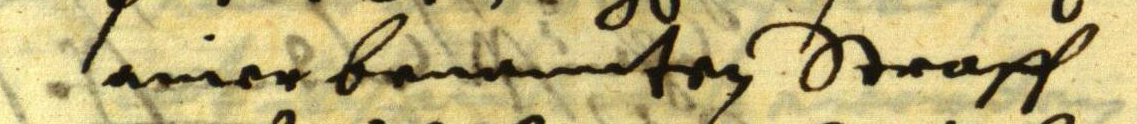ainer benannten Straff
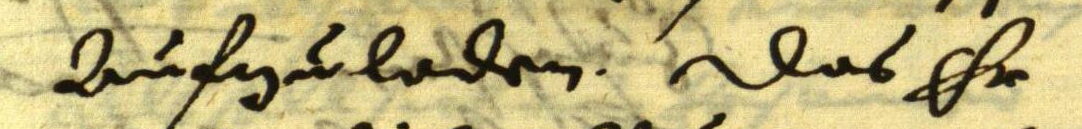Aūfzūladen. Das Er
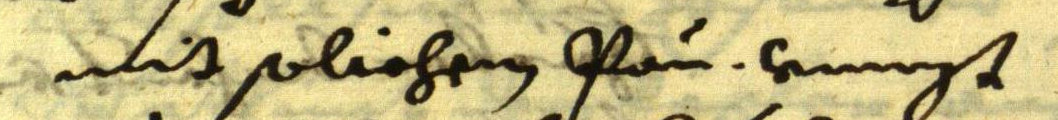mit solichen Paū. vnnzt
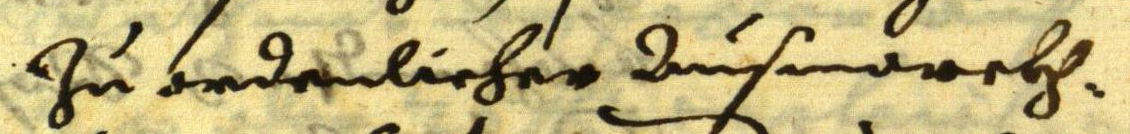Zū ordenlicher Aūsmarckh¬
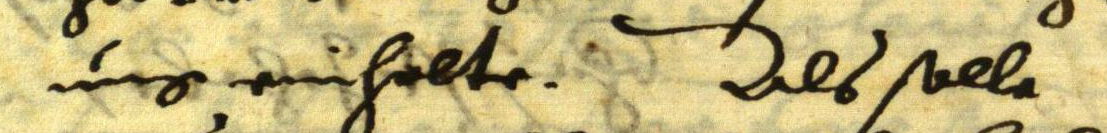ūng einhalte. Als solle
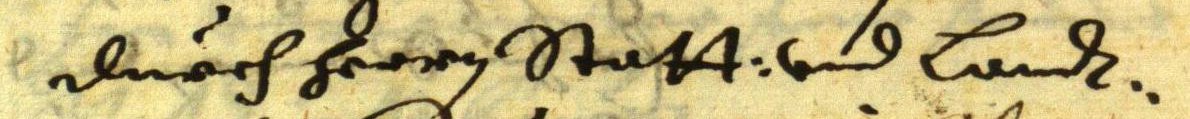dūrch herrn Statt: vnd Landt¬
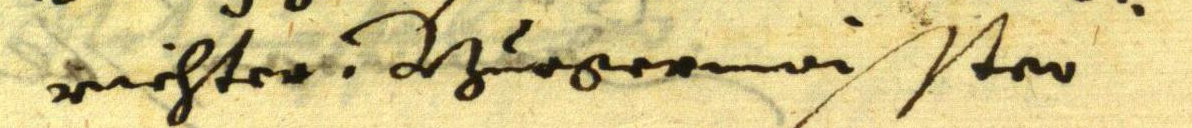richter. Būrgermaisster
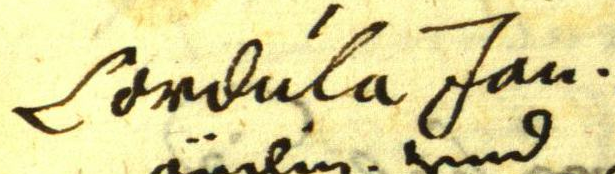Cordūla Jan¬
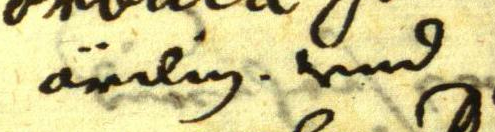ärdin. vnd
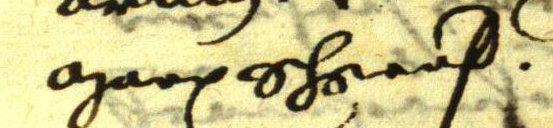Marx Schgraf.
